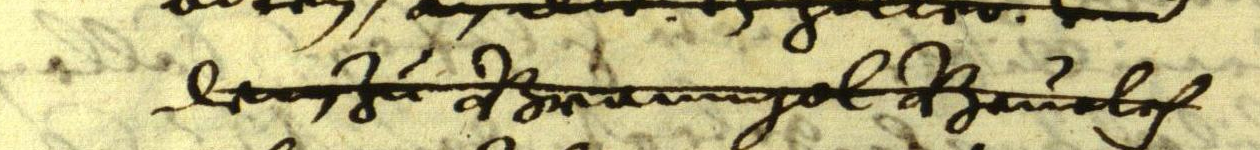dem Zū Brannzol Beūelch
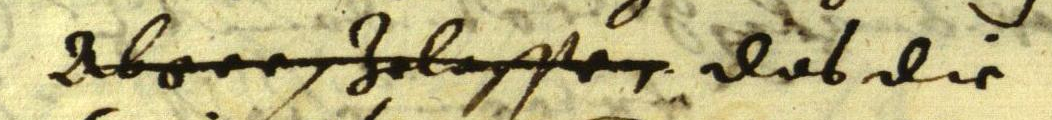Abgeen Zelassen. das die
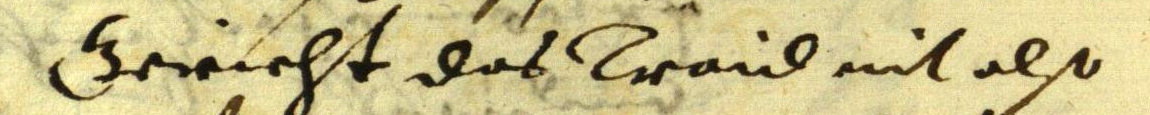Gericht das Traid nit also
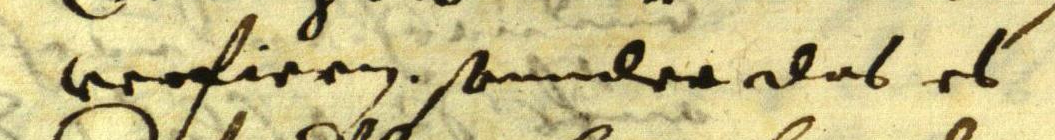verfieren. sonnder das es
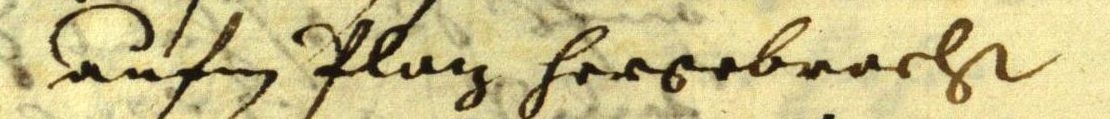aūfm Plaz hergebracht
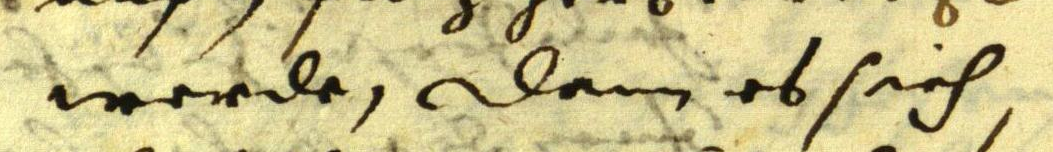werde, Dann es sich
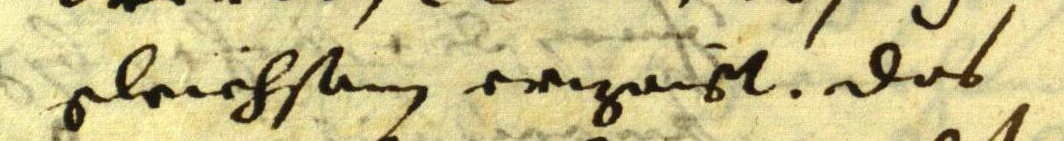gleichsam erzaigt. das
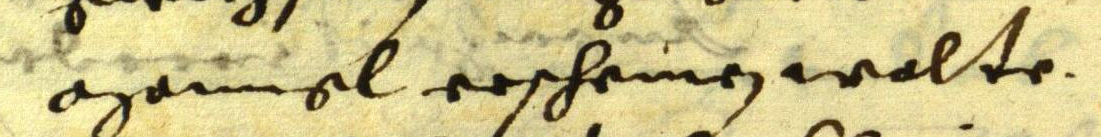Manngl erscheinen wolte.
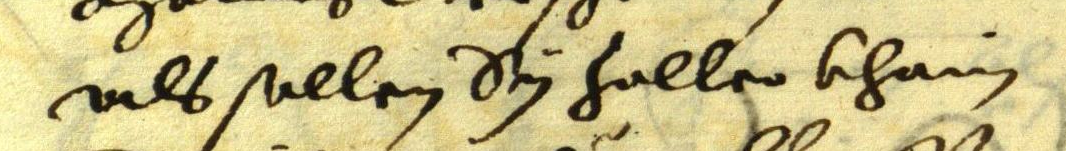als sollen Sÿ Zoller khain
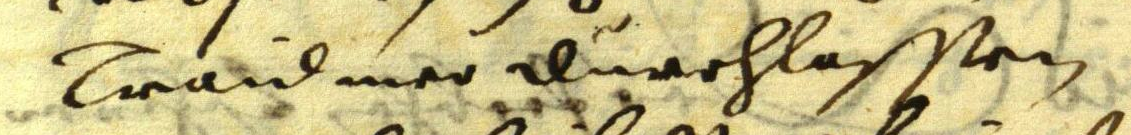Traid mer dūrchlassen
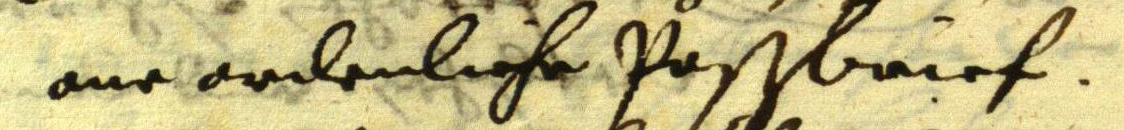one ordenliche Paßbrief.
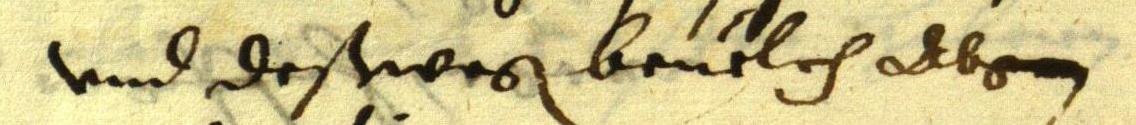vnd deßweg beūelch Abgen¬
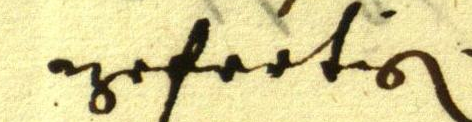zefertig.
